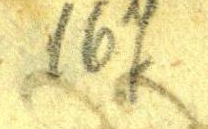167
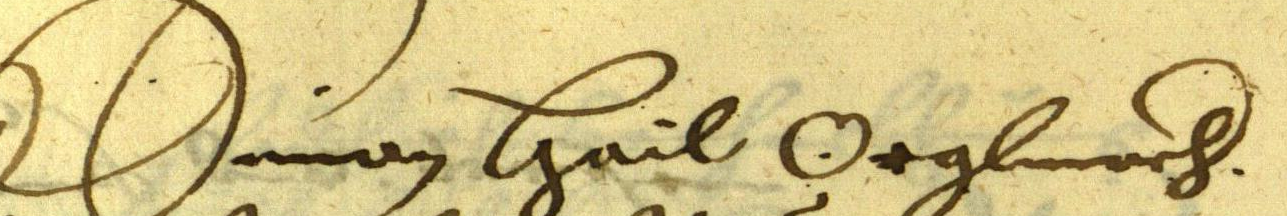Simon Hail Orglmach
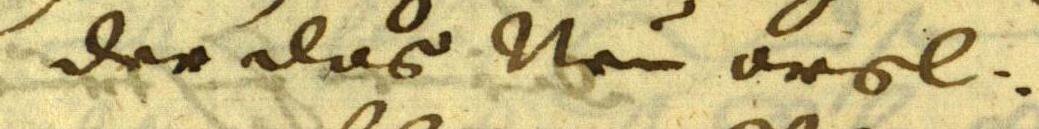der das Neū Orgl¬
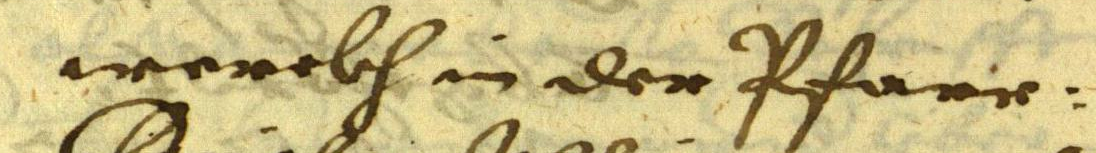werckh in der Pfarr¬
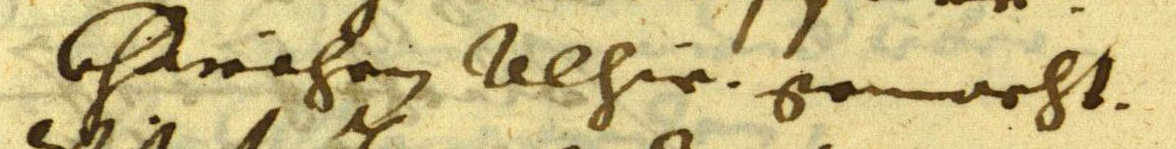khirchen Alhie. gemacht.
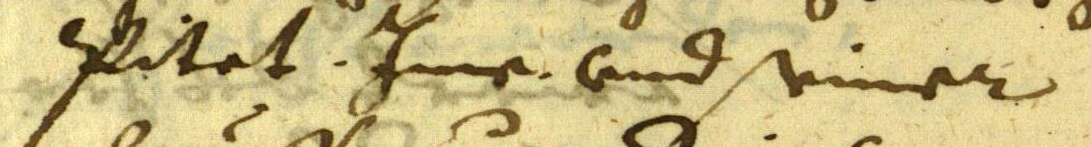Pitet. Ime. vnd seiner
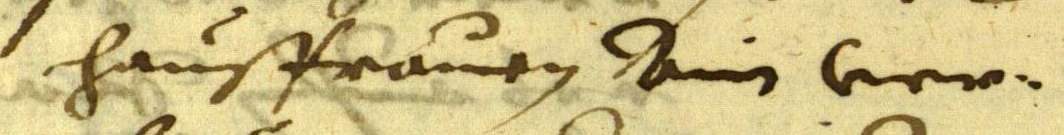haūsfraūen Ain ver¬
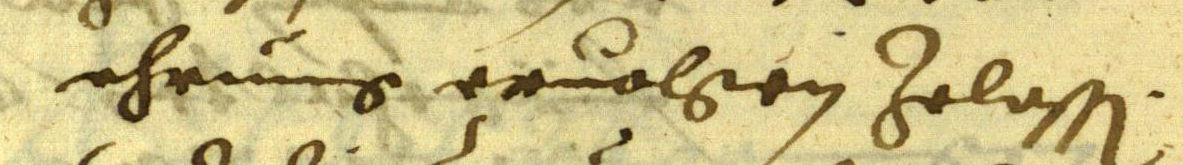ehrūng erūolgen Zelass.
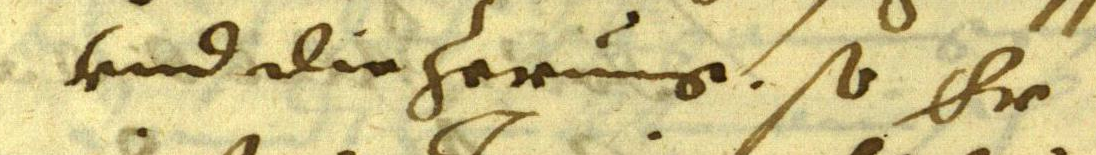vnd die Zerūng. so Er
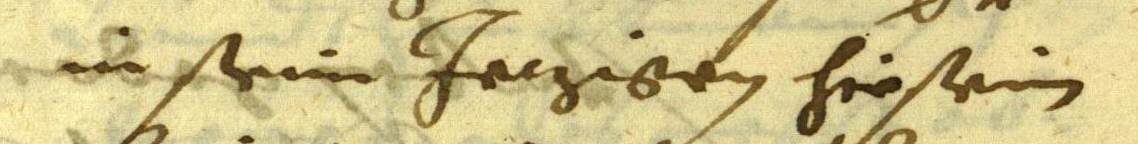in sein Jetzigen hiesein
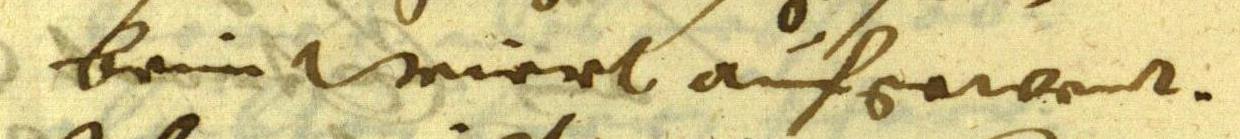beim Wiert aūfgewent.
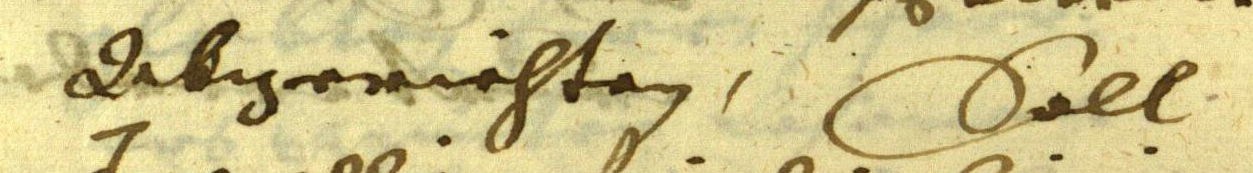Abzerichten, Soll
